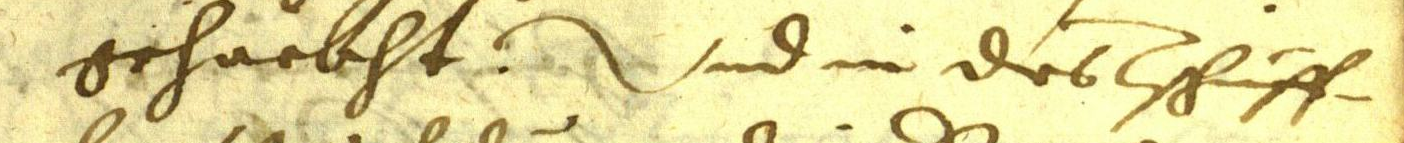gehackht. Vnd in des Tschūff¬
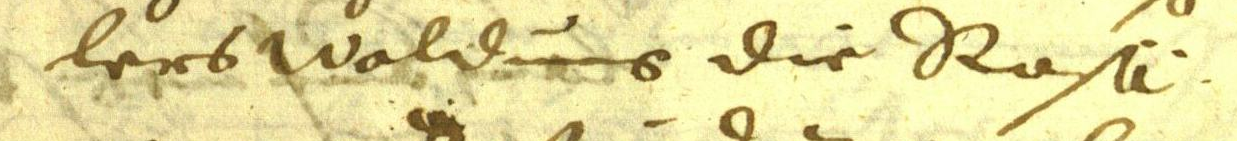lers Waldūng die Rosä
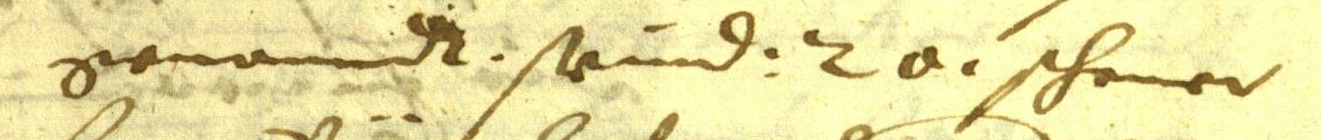genanndt. seind: 20. schener
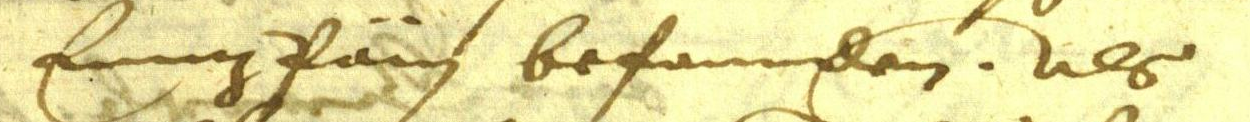Ennz Päm befannden. Als
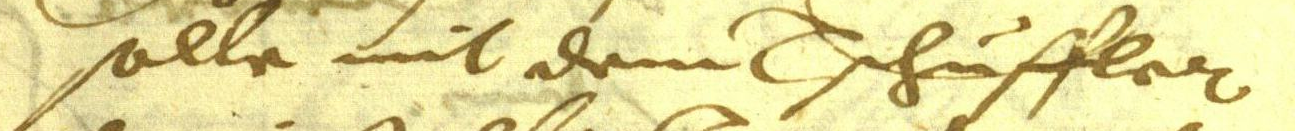solle mit dem Tschūffler
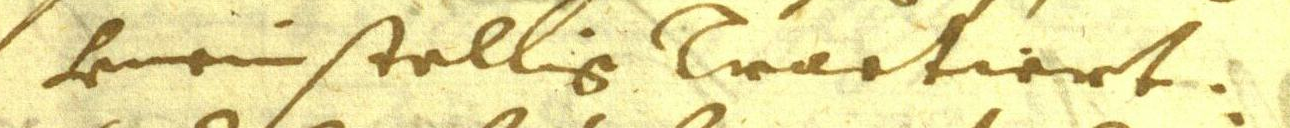vneinstellig Tractiert¬
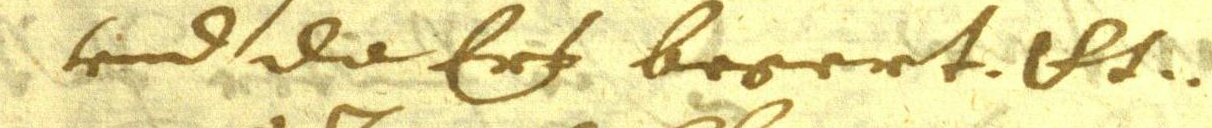vnd da Ers begert. Et¬
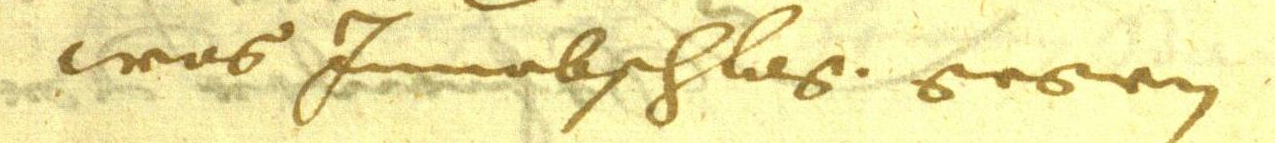was Innabschlag. gegen
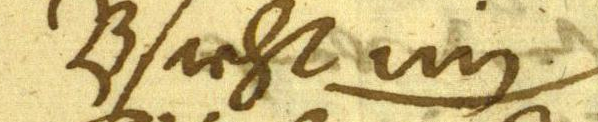Bsicht im
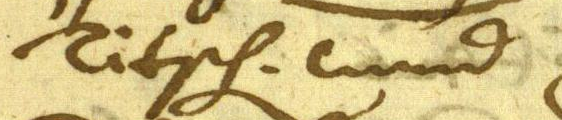Titsch. vnnd
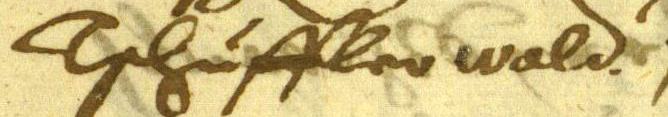Tschūffler wald.
